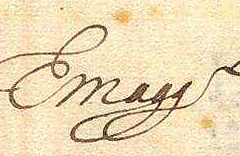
Em aggo
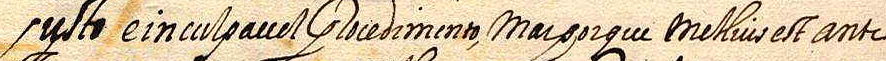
justo e inculpauel procedimento, mas porque mellius est ante
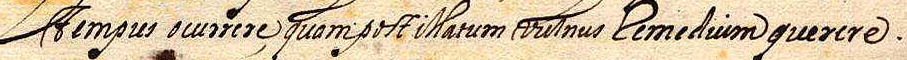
tempus ocurrere, quam post illatum vulnus Remedium querere.
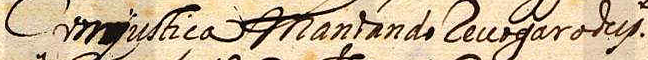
Com justiça mandando Reuogar o desp.o
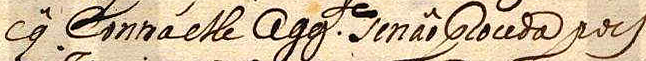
e q̄. Contra elle Agg.te se naõ proceda pois
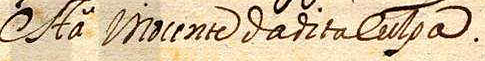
estâ inocente da dita culpa.
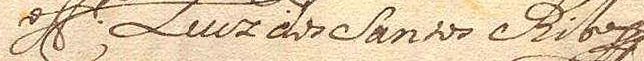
off.o Luiz dos Santos Ribo
